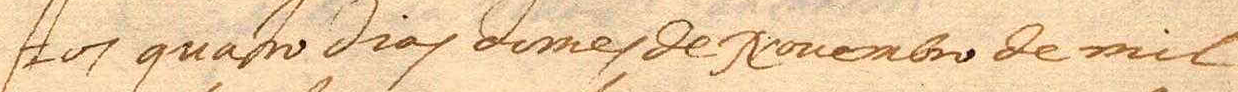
Aos quatro dias do mes de Nouembro de mil
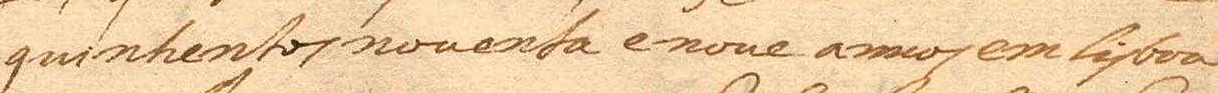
quinhentos nouenta e noue annos em lisboa
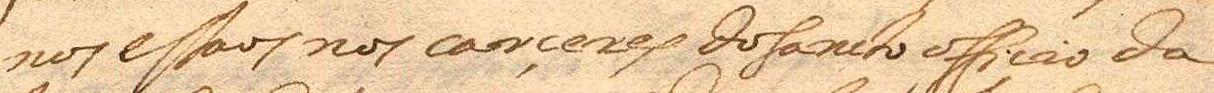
nos estaos nos carçeres do Sancto officio da
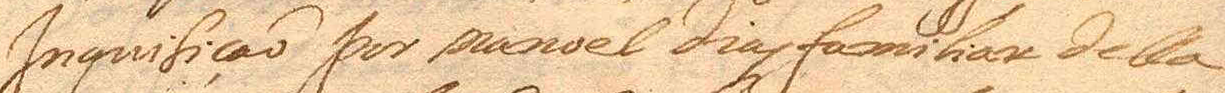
Jnquisição por manoel dias familiar della
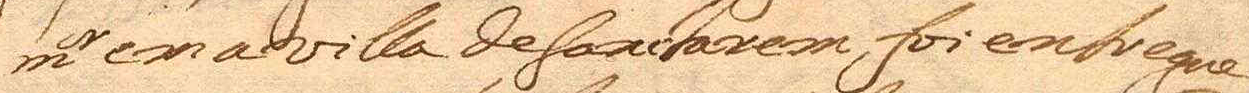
mor em a villa de Sanctarem foi entregue
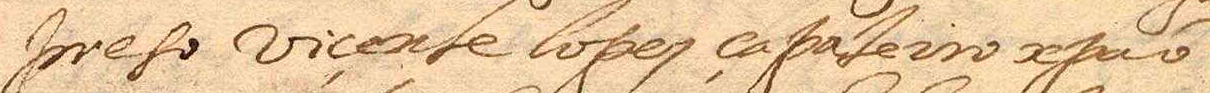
preso vicente lopez çapateiro xpaõ
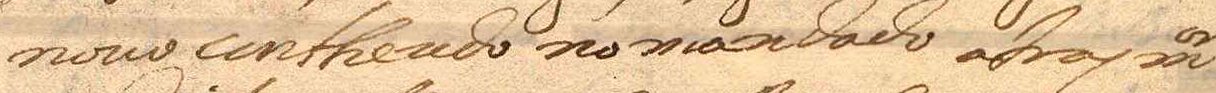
nouo contheudo no mandado atras mor
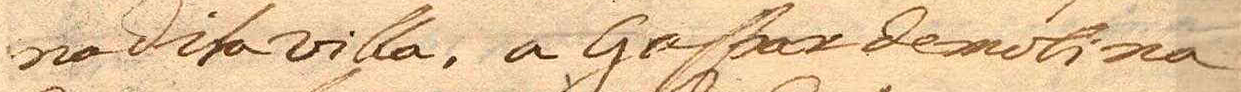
na dita villa, a Gaspar de molina
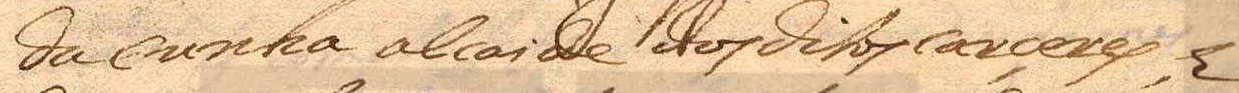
da cunha alcaide dos ditos carçeres E
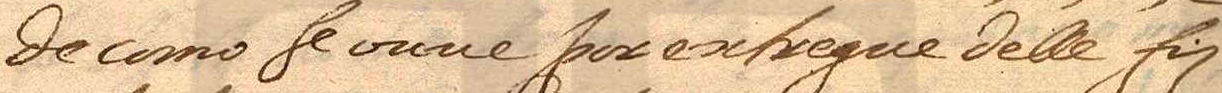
de como se ouue por entregue delle fiz
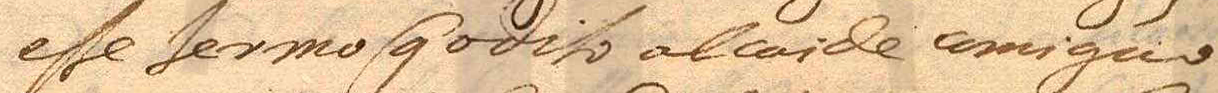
este termo q̄ o dito alcaide comiguo
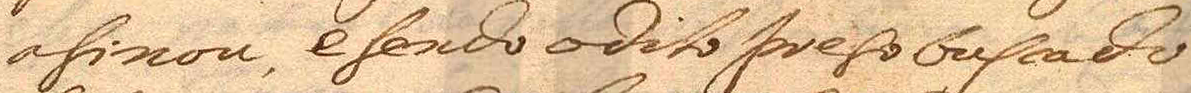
asinou, e sendo o dito preso buscado
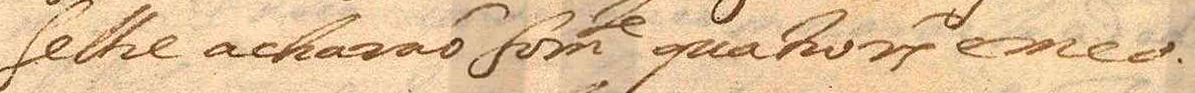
se lhe acharaõ somte quatro rs̄ e meo.
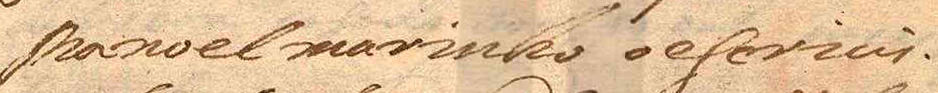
Manoel marinho o escriui.
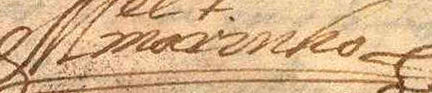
Mel marinho
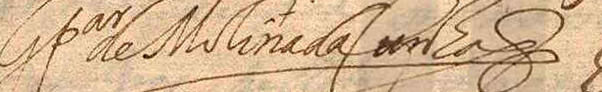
Gpar de Molina da Cunha
